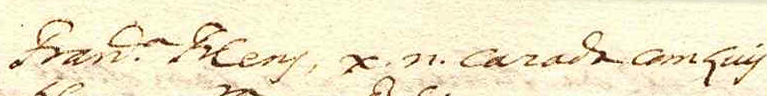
Fran.ca Hens, x. n. cazada com Luis
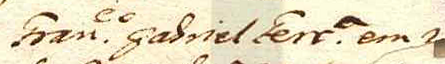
Fran.co Gabriel Ferr.a em 2
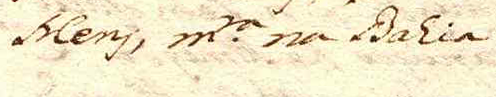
Hens, mr.a na Bahia
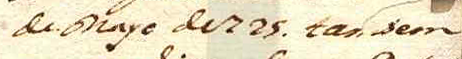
de Mayo de 725. tambem
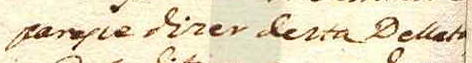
paresce dizer desta Dellata
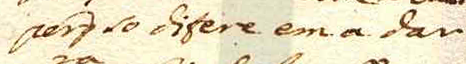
porq̄ so difere em a dar
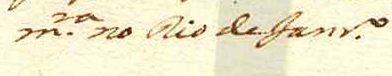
m.ra no Rio de Janr.o
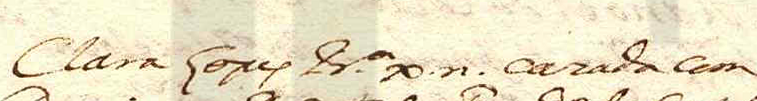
Clara Lopes Pr.a x. n. cazada com
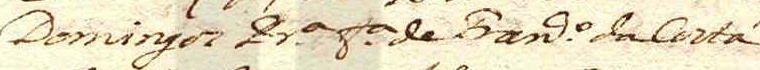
Domingos Pr.a f.a de Fran.co da Costa
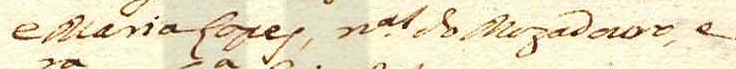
e Maria Lopes, na.l do Mogadouro, e
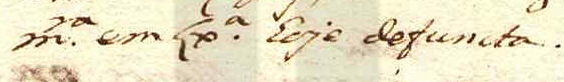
m.ra em Lx.a hoje defuncta.
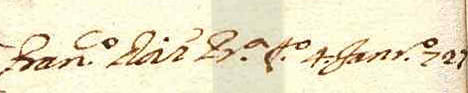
Fran.co Roiz̄ Pr.a f.o 4. Janr.o 727
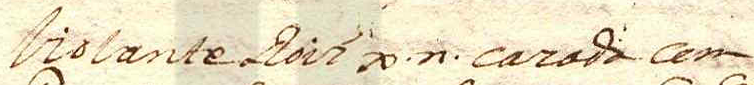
Violante Roiz̄ x. n. cazada com
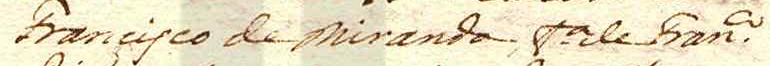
Francisco de Miranda, f.a de Fran.co
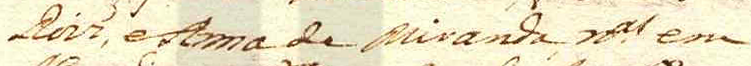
Roiz̄, e Anna de Miranda n.al em
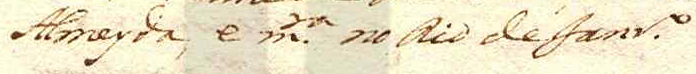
Almeyda, e m.ra no Rio de Janr.o
